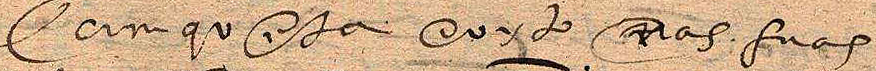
E cimqoēta e oyto nas suas
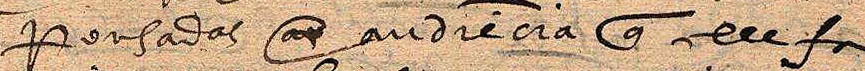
pousadas aē audiēcia q̄ elle fa
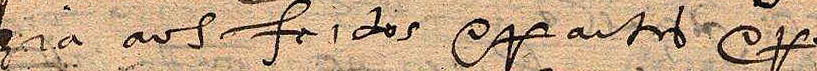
zia aos feitos e partes e po
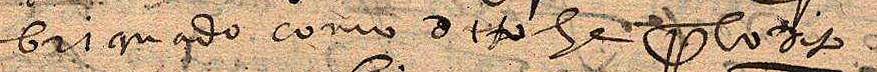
briquado como dito he p̄lo dito
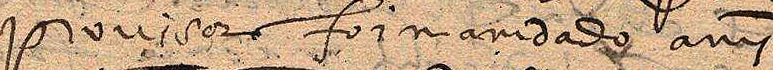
prouisor foi mamdado a mj̄
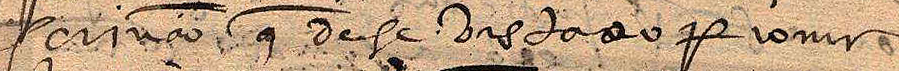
scriuão q̄ dese vista ao prome
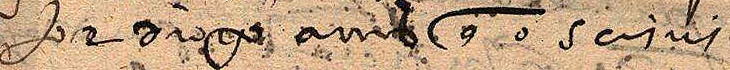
tor diogo aires q̄ o scriui
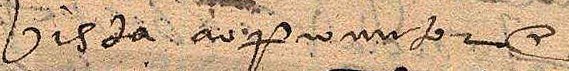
Vista ao promotor ē
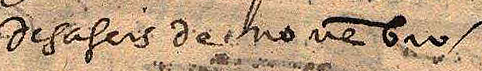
desaseis de nouēbro/
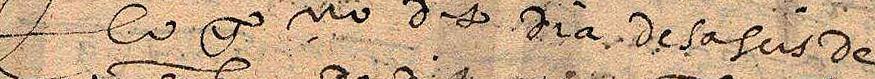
E logo no dito dia desaseis de
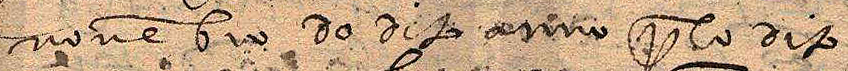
noūebro do dito anno p̄lo dito
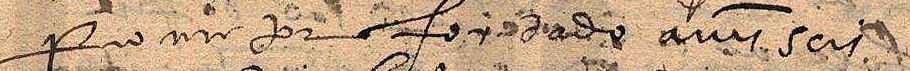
prometor foy dado a mī scri
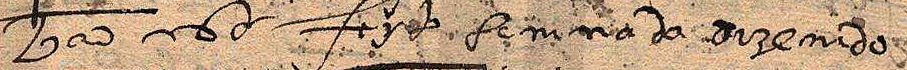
vão este feyto sem nada dizemdo
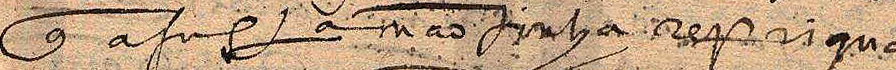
q̄ a Justa não tinha repriqua
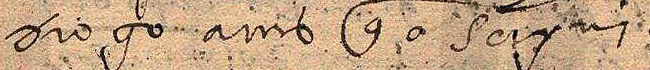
diogo aires q̄ o scryui
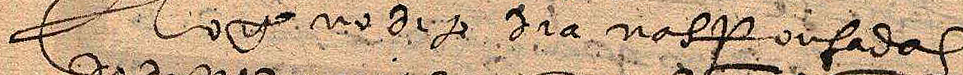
E logo no dito dia nas pousadas
